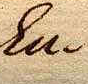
Eu
